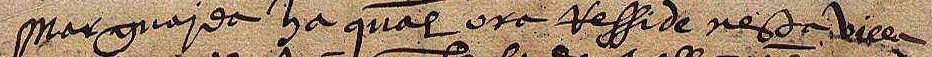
Marguajda ha quāl ora Resside nesta villa
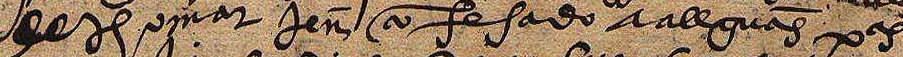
de thomar tem c̄ofesado a allguās pas
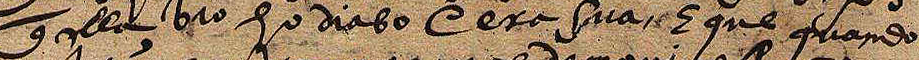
q̄ ella vio ho diabo e era sua, E que quando
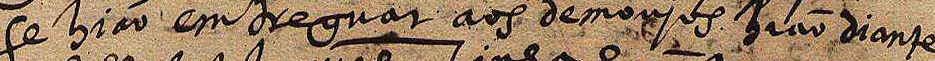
se hiaõ emtreguar aos demonjos hiaõ diante
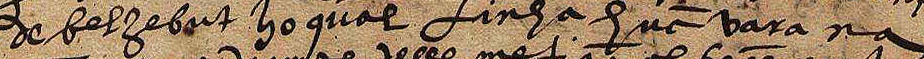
de belzebut ho quāl tinha huā vara na
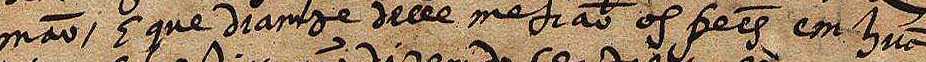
mão / E que diamte delle metiaõ os peēs em huā
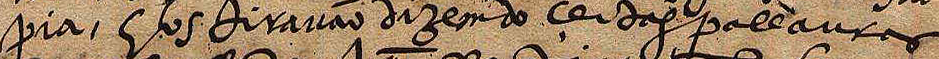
pia, E os tirauão dizemdo çertas pallauras
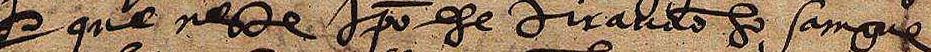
e que neste tpō lhe tirauão ho samgue
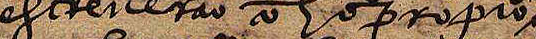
escreuerão c̄o ho proprio
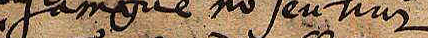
samgue no seu liurro
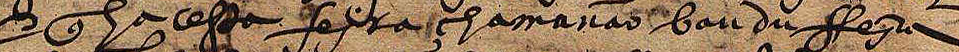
e q̄ ha cesta fejra chamauão baudu ffejra
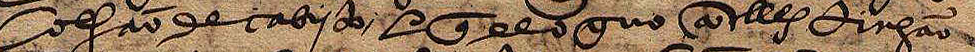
Colhaõ de cabrjto, e q̄ lloguo c̄o elles tinhão
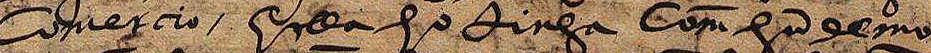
Comercio / E ella ho tinha com̄ hū demo
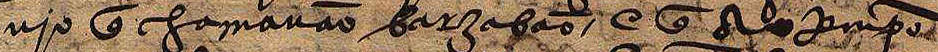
njo q̄ chamauão barzabaõ, e q̄ Ao tempō
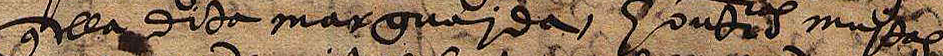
q̄ ella dita marguajda, E outras mujtas
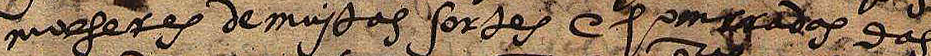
molheres de mujtas sortes e homrradas das
